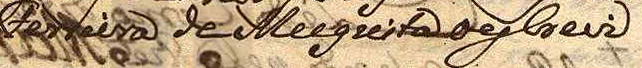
Ferreira de Mesquita o esCrevi
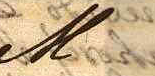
M
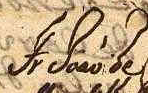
Fr Ioaõ de
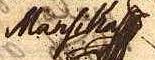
Mansilha
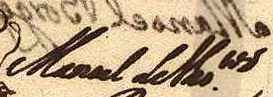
Manoel de V.cos
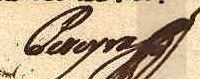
Pereyra
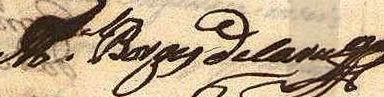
M.e Borges de Caruo
